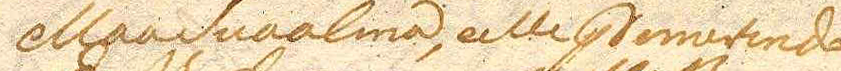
ella a Sua alma, e elle prometendo
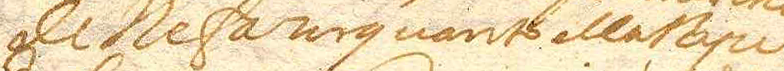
de lhe fazer quanto ella lhe pe
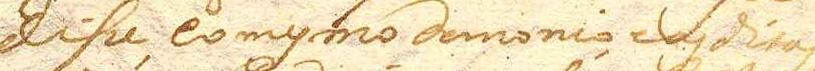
disse, e o mesmo demonio, e as ditas
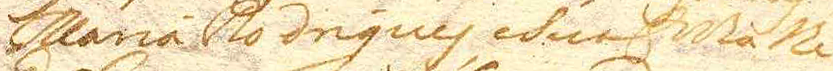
Maria Rodrigues, e sua filha lhe
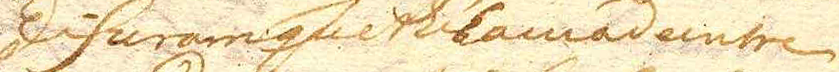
disseram que lhe hauia de entre
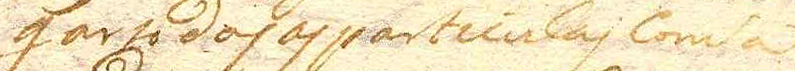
gar todas as particulas comsa
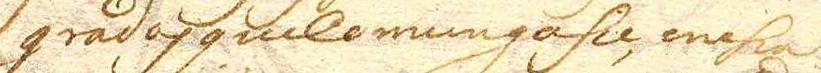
gradas que comungasse, e nessa
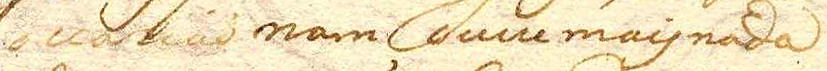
occaziaõ nam ouue mais nada
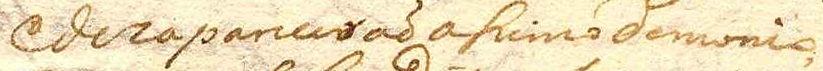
e dezapareceraõ assim o demonio,
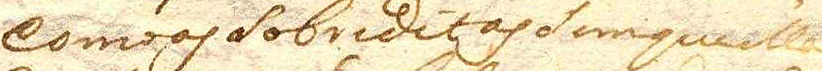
como as sobreditas sem que ella
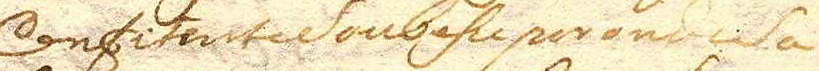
Confitente Soubesse por onde Sa
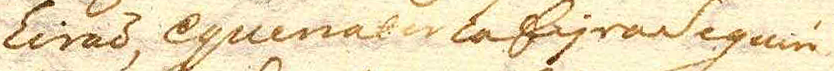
hiraõ, e que na terca fejra seguin
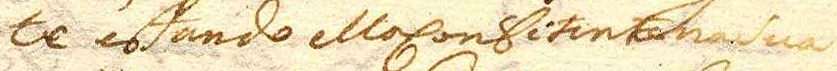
te estando ella Confitente na sua
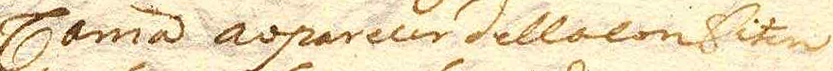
Cama ao parecer della confiten
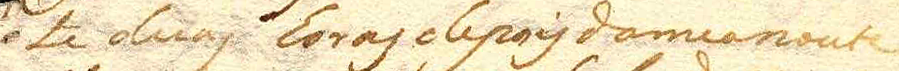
te duas horas depois da mea noute
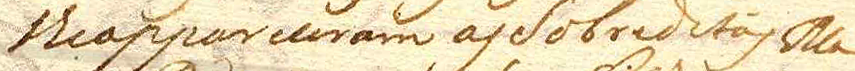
lhe appareceram as Sobreditas Ma
